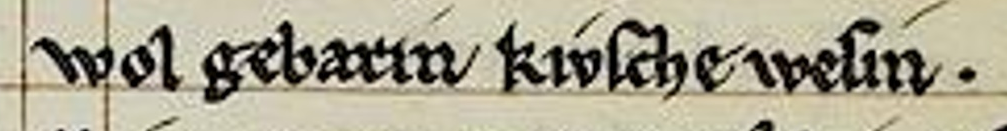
Wol gebarin kivſche weſin.
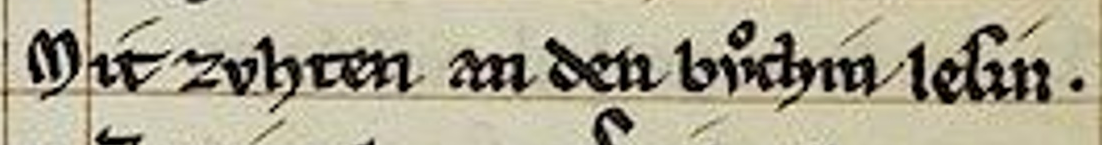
Mit zvhten an den bv°ochin leſin.
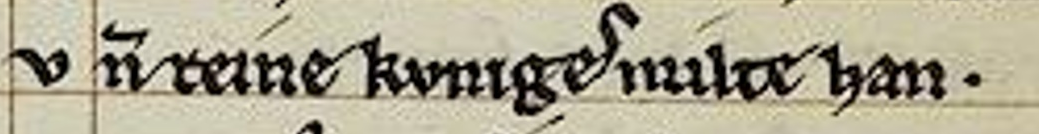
Vn(d) reine kvnige°(ſ) milte han.
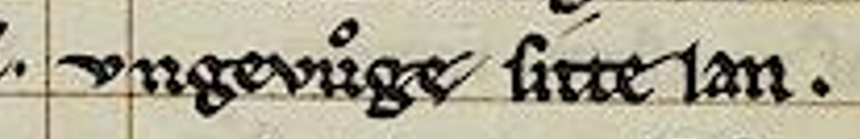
Vngevu°oge ſitte lan.
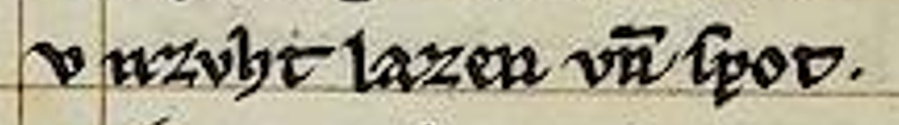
Vnzvht lazen vn(d) ſpot.
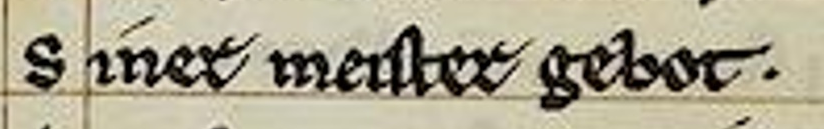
Siner meiſter gebot.
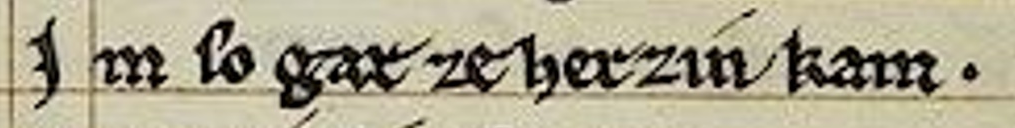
Im ſo gar ze herzin kam.
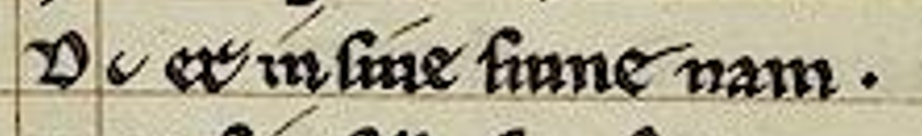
D(az) er in ſine ſinne nam.
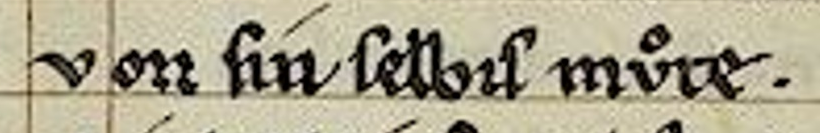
Von ſin ſelbiſ mv°ote.
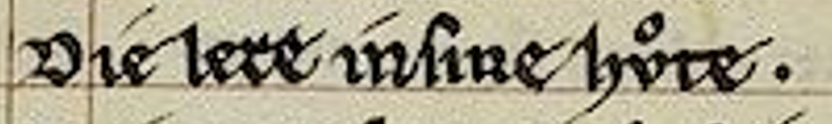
Die lere inſine hv°ote.
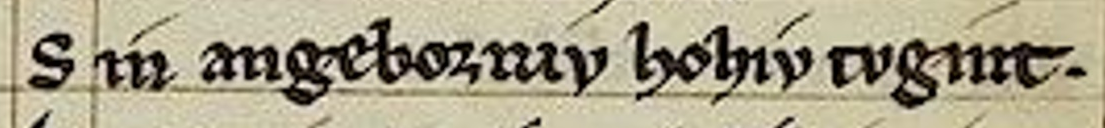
Sin angeborniv hohiv tvgint.
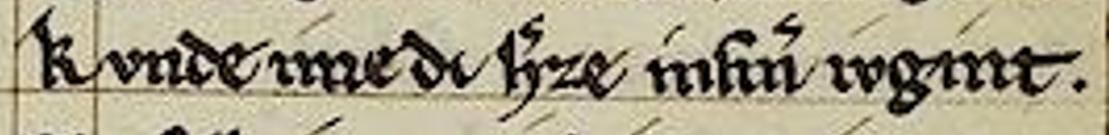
Kvnde ime d(az) h(er)ze inſin(er) ivgint.
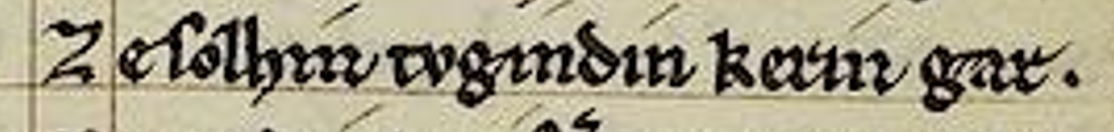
Ze ſolhin tvgindin kerin gar.
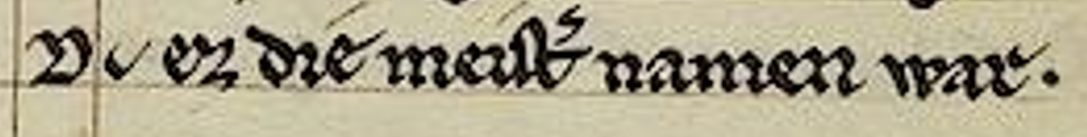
D(az) ez die meiſt(er) namen war.
